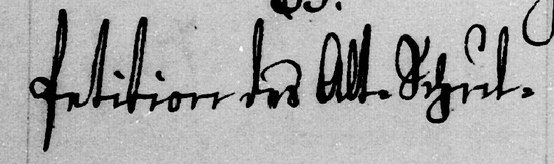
tellen beschlo¬
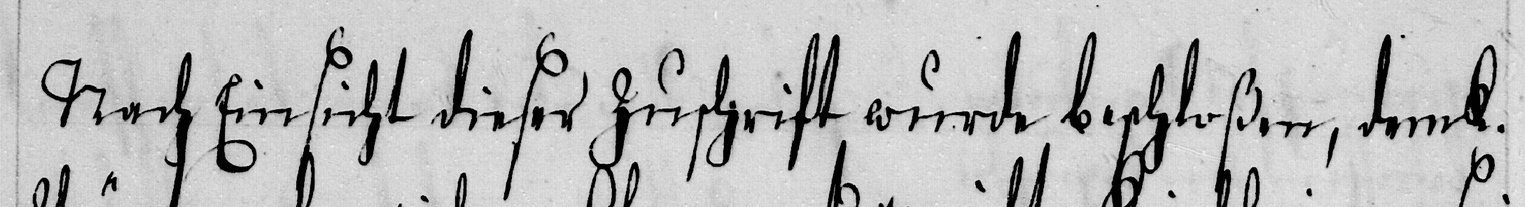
Nach Einsicht dieser Zuschrift wurde beschloßen, dem K.
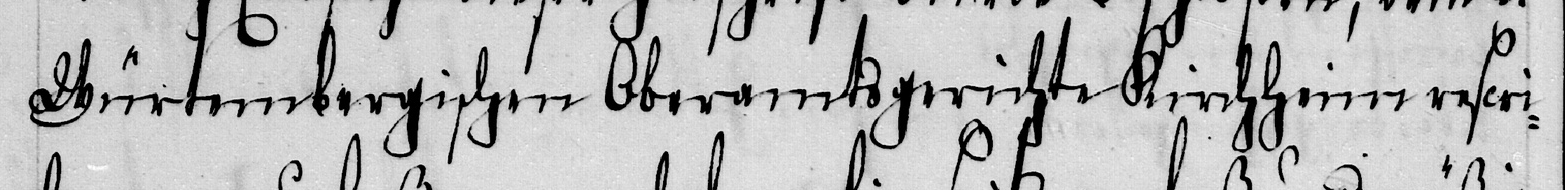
Würtembergischen Oberamtsgerichte Kirchheim rescri¬
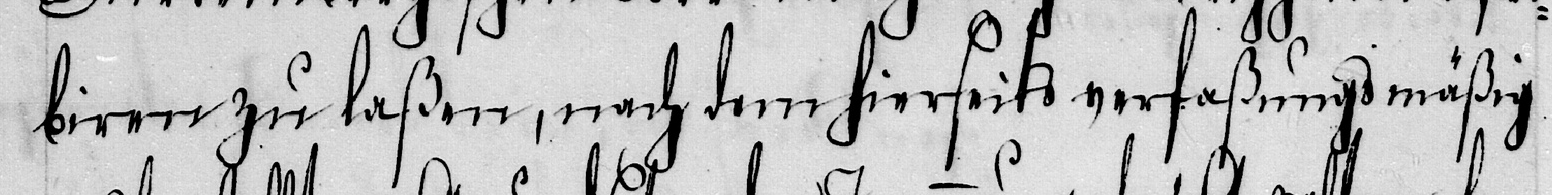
biren zu laßen, nach dem hierseits verfaßungsmäßig
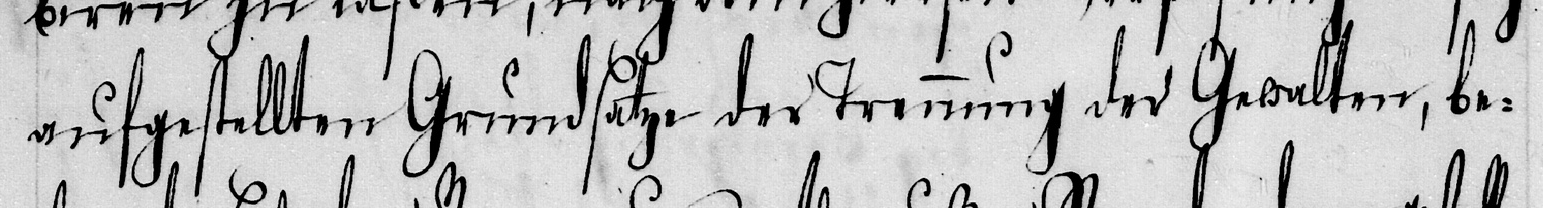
aufgestellten Grundsatze der Trennung der Gewalten, be¬
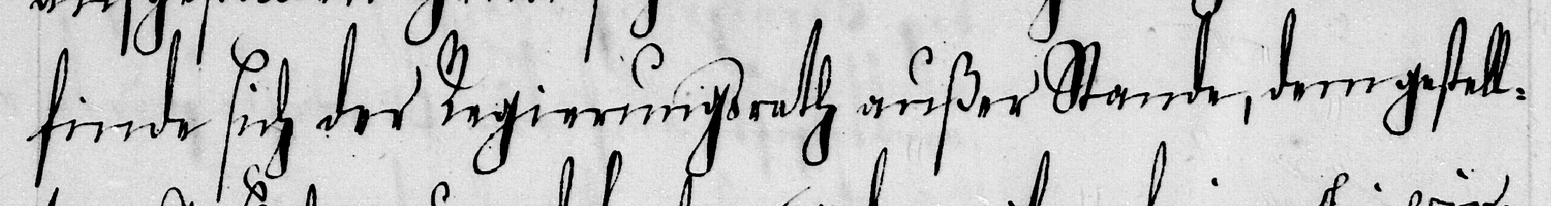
finde sich der Regierungsrath außer Stande, dem gestel¬
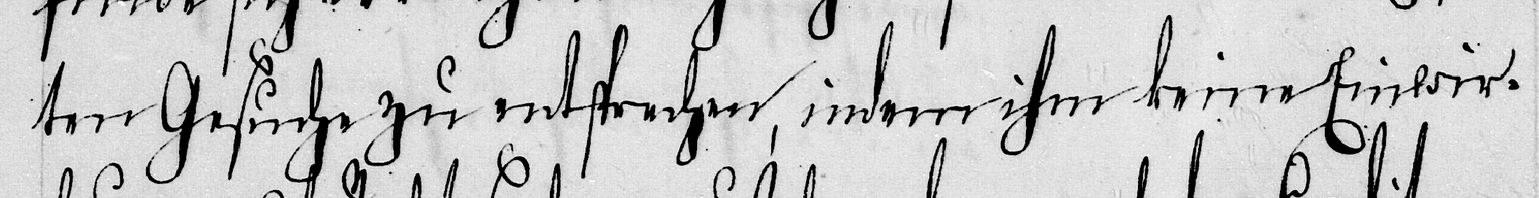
lten Gesuche zu entsprechen, indem ihm keine Einwir¬
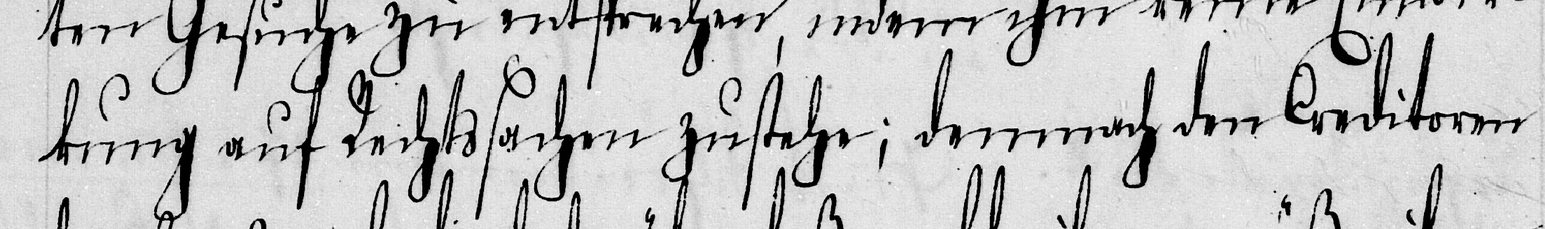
kung auf Rechtssachen zustehe; demnach den Creditoren
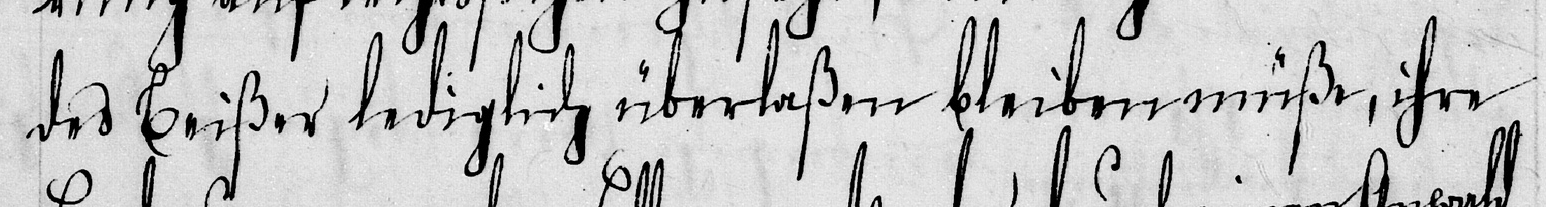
des Beißer lediglich überlaßen bleiben müße, ihre
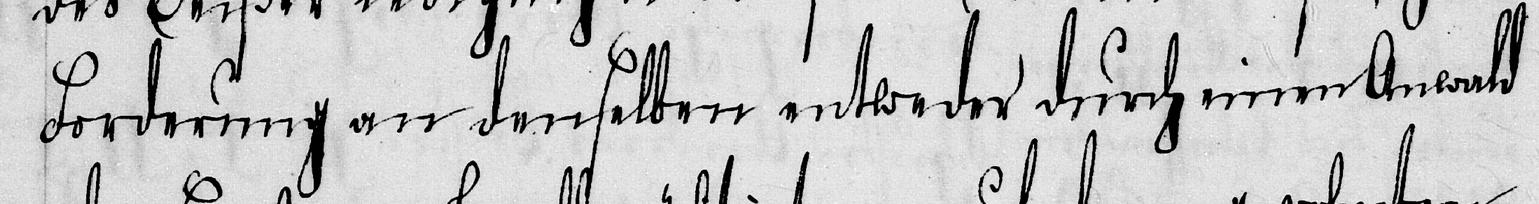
Forderung an denselben entweder durch einen Anwalt
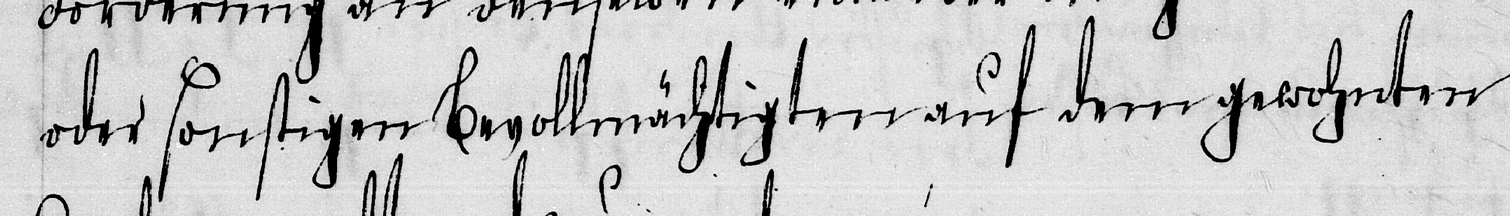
oder sonstigen Bevollmächtigten auf dem gewohnten
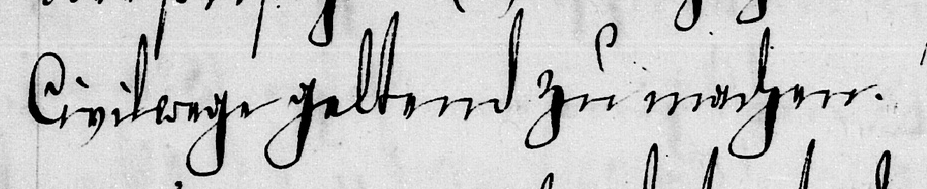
Civilwege geltend zu machen.
